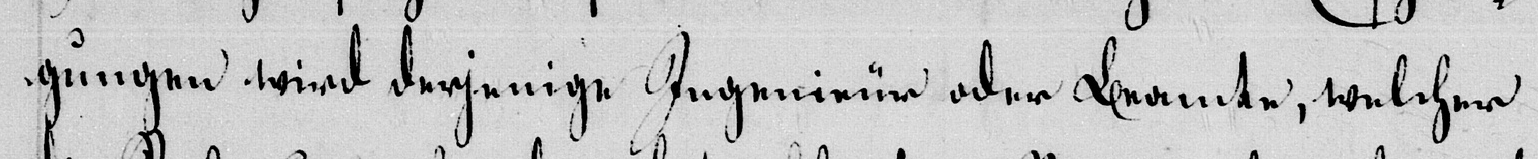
gungen wird derjenige Ingenieur oder Beamte, welcher
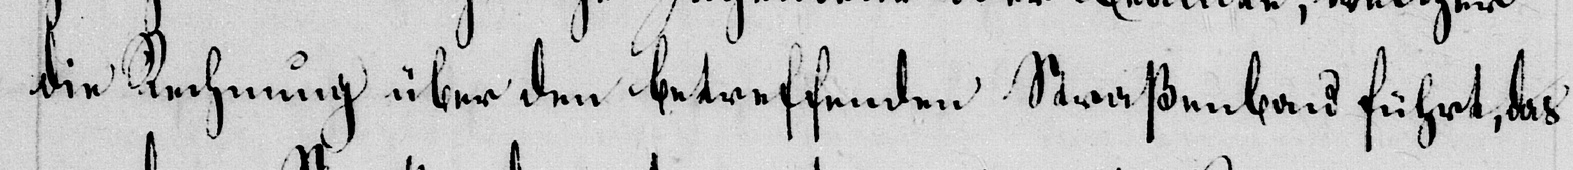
die Rechnung über den betreffenden Straßenbau führt, das
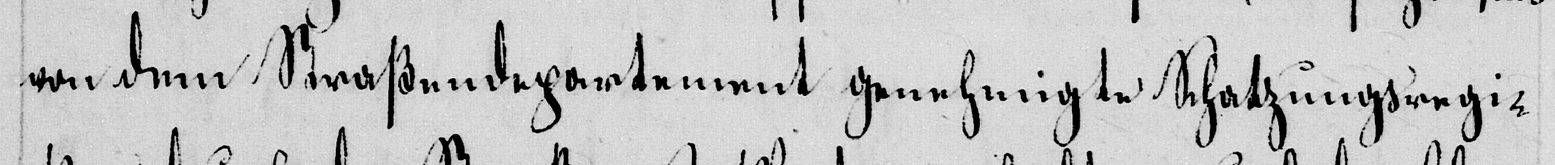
von dem Straßendepartement genehmigte Schatzungsregi¬
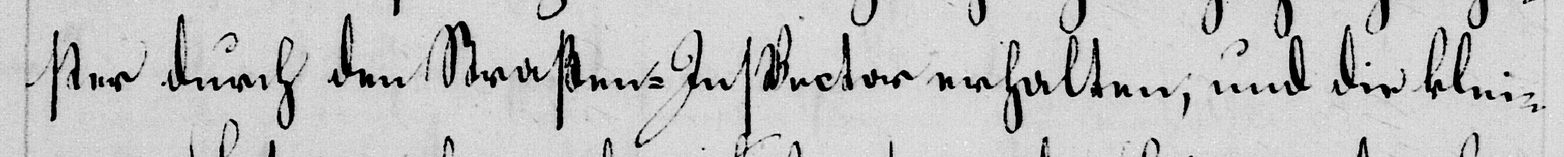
ster durch den Straßen-Inspector erhalten, und die klei¬
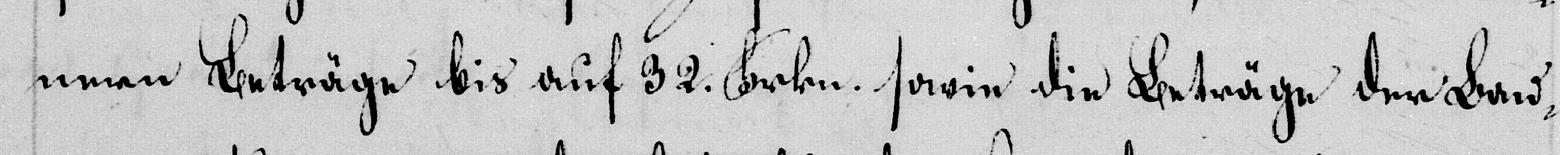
nern Beträge bis auf 32. Frkn. sowie die Beträge der Bau¬
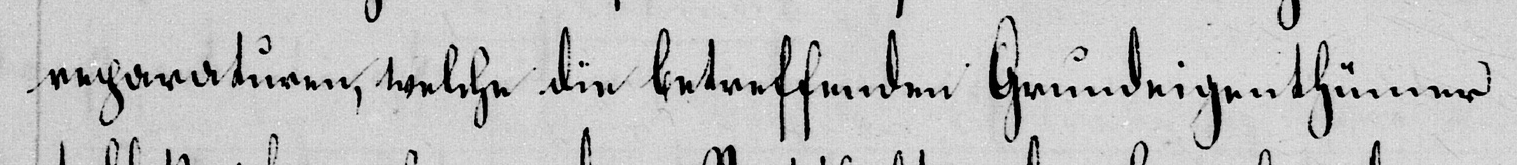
reparationen, welche die betreffenden Grundeigenthümer
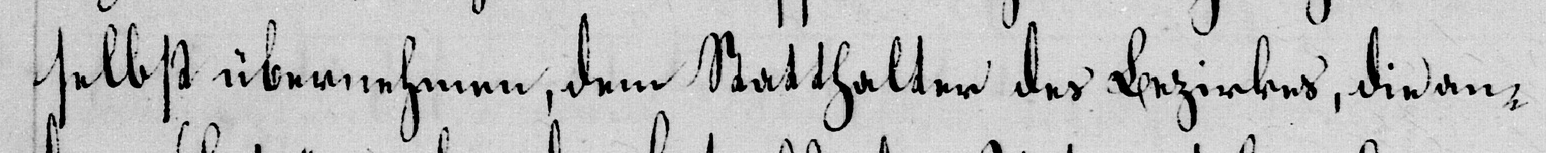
selbst übernehmen, dem Statthalter des Bezirkes, die an¬
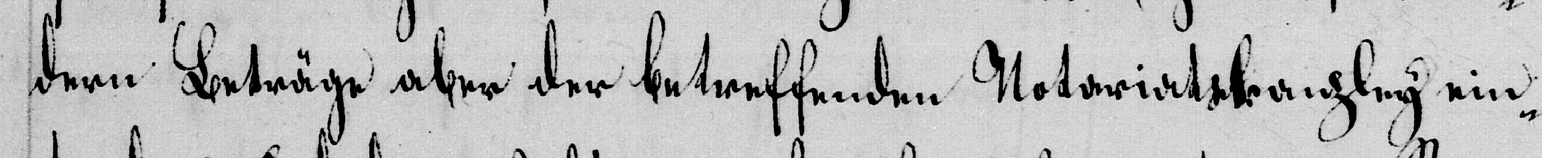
dern Beträge aber der betreffenden Notariatskanzley ein¬
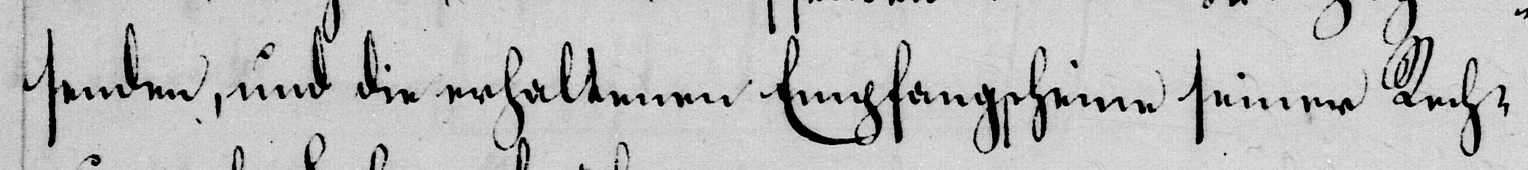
senden, und die erhaltenen Empfangsscheine seiner Rech¬
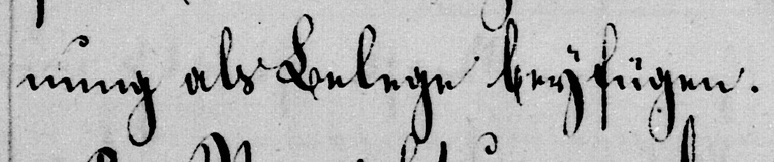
nung als Belege beyfügen.
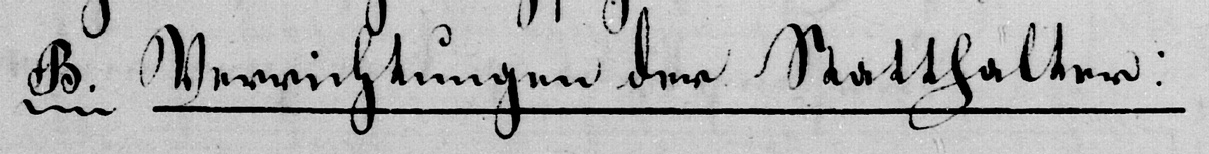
B. Verrichtungen der Statthalter:
